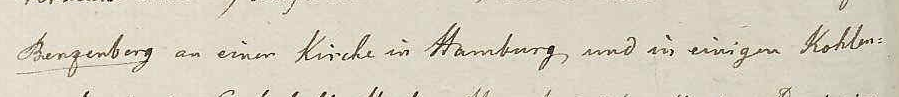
Benzenberg an einer Kirche in Hamburg, und in einigen Kohlen-
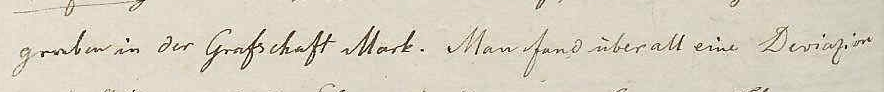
gruben in der Grafschaft Mark. Man fand überall eine Deviazion
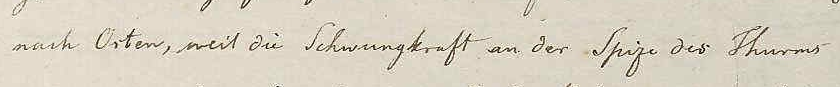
nach Osten, weil die Schwungkraft an der Spize des Thurms
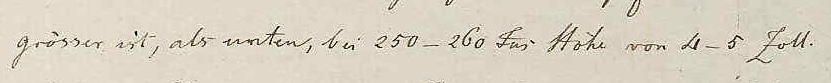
grösser ist, als unten, bei 250–260 Fus Höhe von 4–5 Zoll.
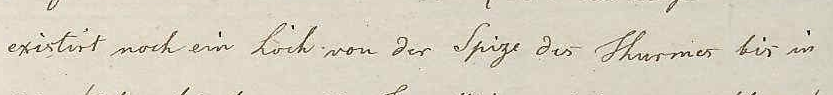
existirt noch ein Loch von der Spize des Thurmes bis in
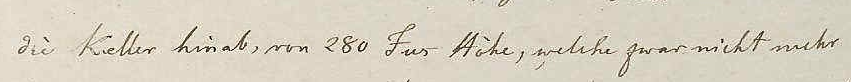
die Keller hinab, von 280 Fus Höhe, welche zwar nicht mehr
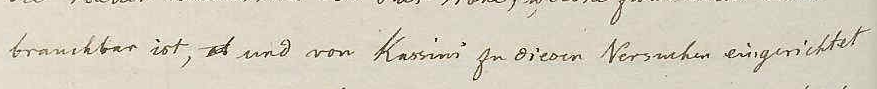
brauchbar ist, ob und von Kassini zu diesen Versuchen eingerichtet
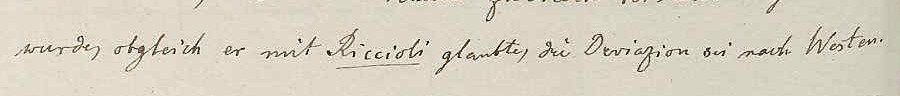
wurde, obgleich er mit Riccioli glaubte, die Deviazion sei nach Westen.
